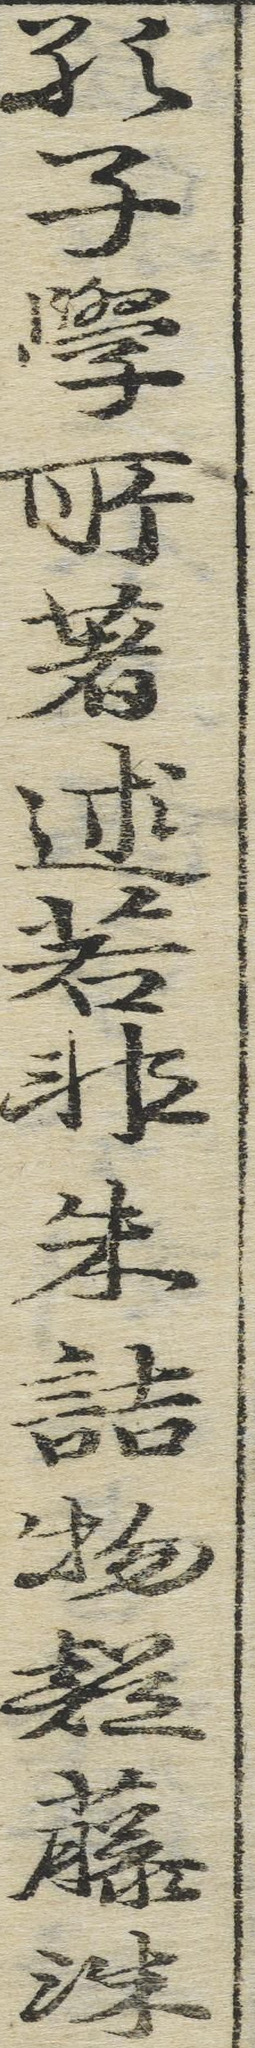孔子学所著述若非朱詰物疑藤洙
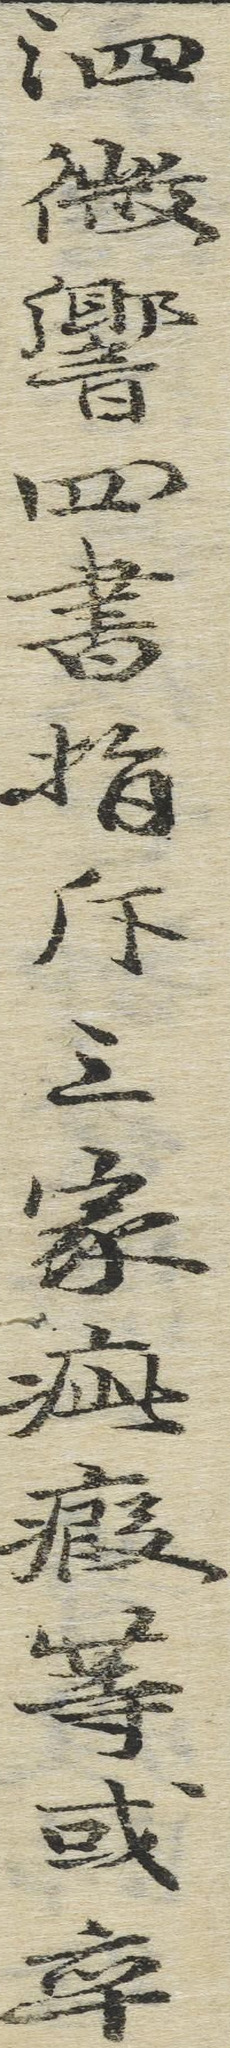泗微響四書指斥三家疵瘕等或卒
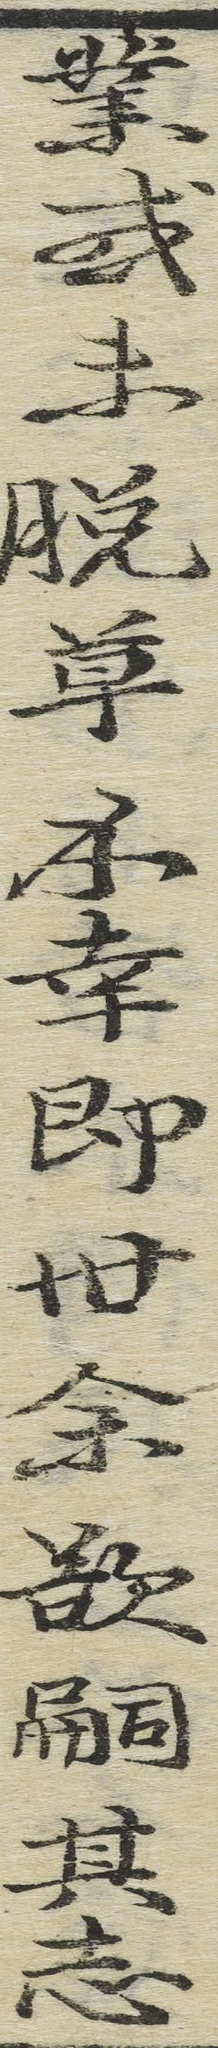業或未脱草不幸即世余欲嗣其志
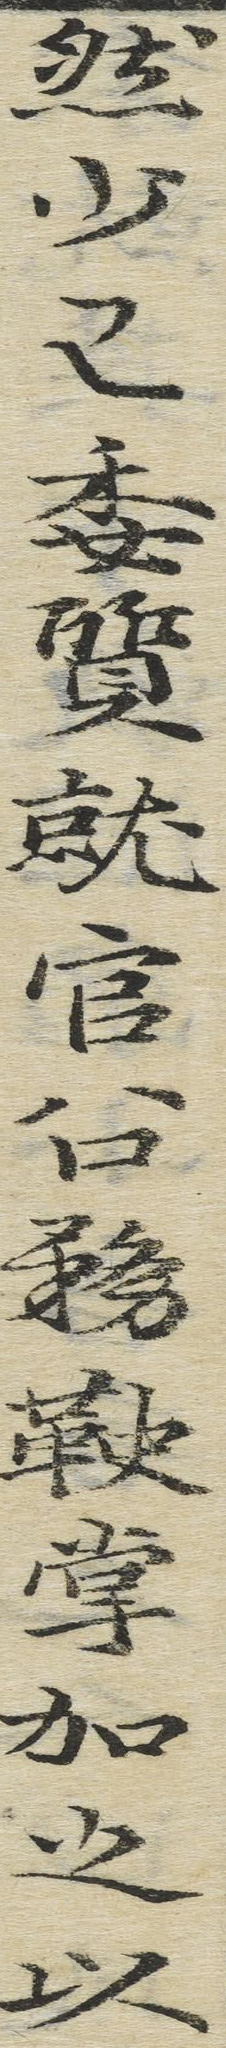然少己委質就官公務鞅掌加之以
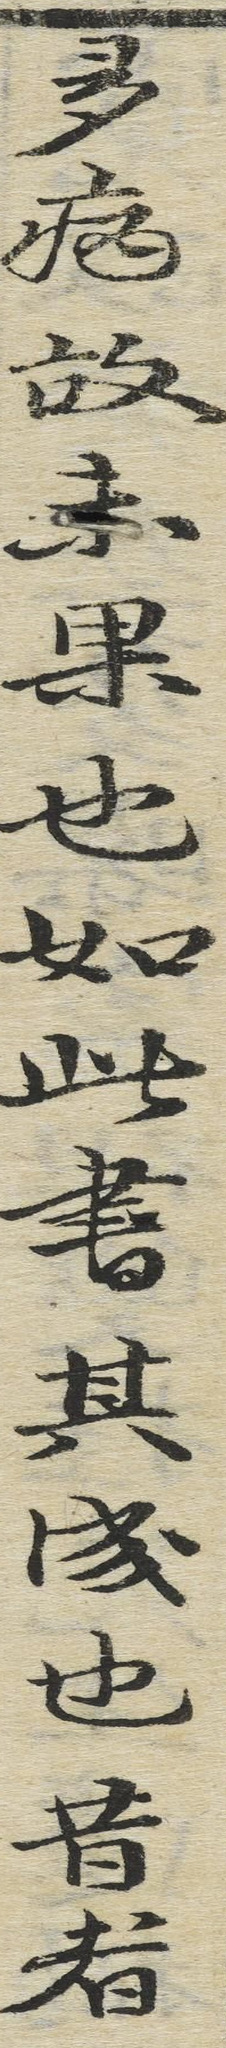多病故未果也如此書其成也昔者
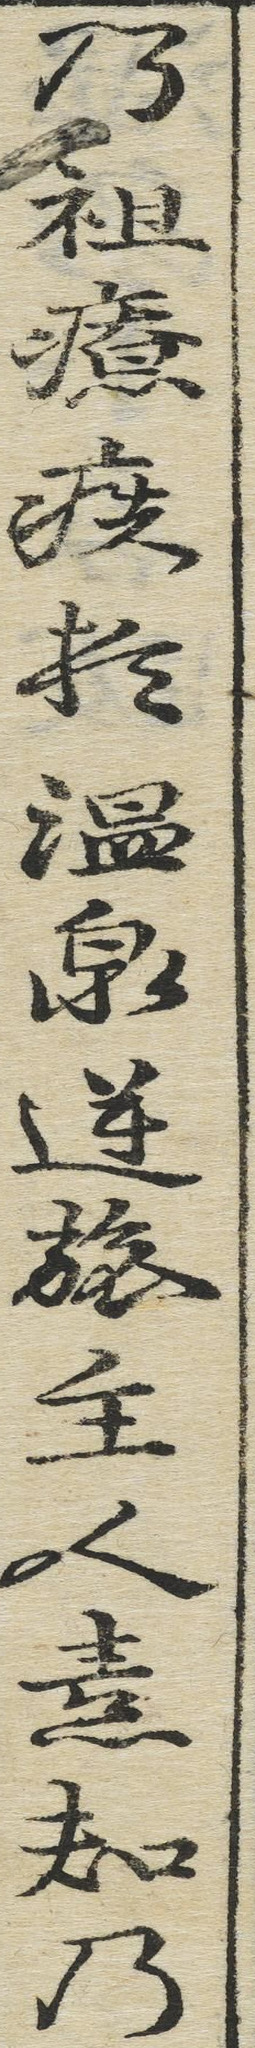乃祖療疾於温泉逆旅主人意知乃
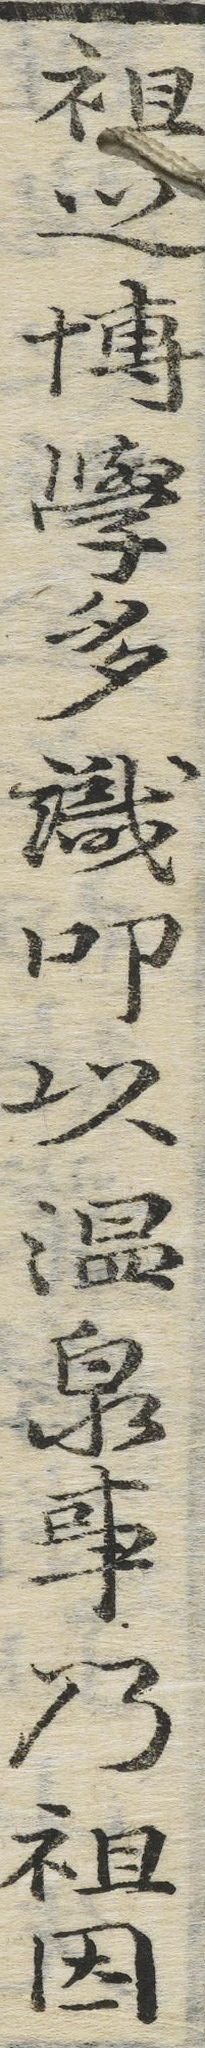祖之博学多識叩以温泉或乃祖因
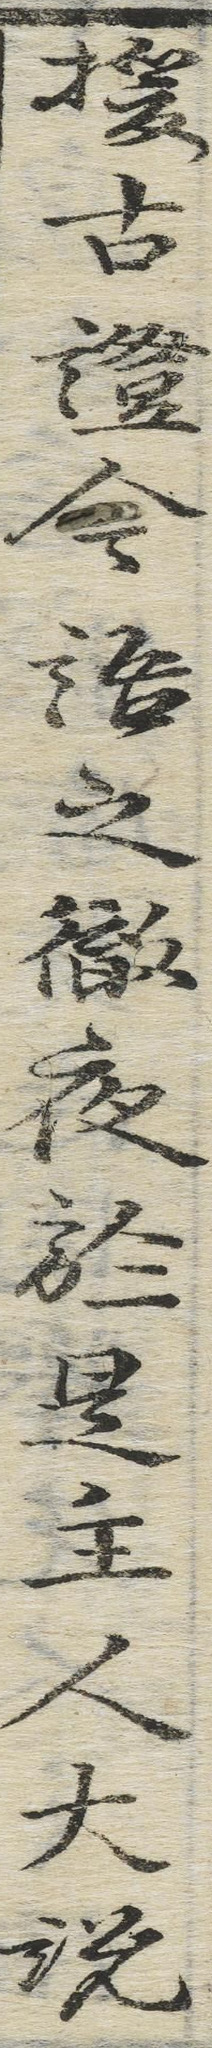援古証今語之徹夜於是主人大説
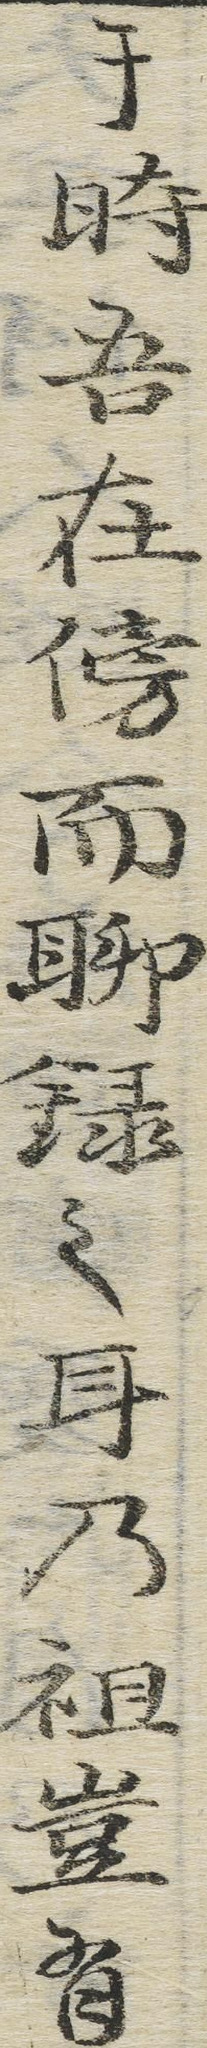于時吾在傍而聊録之耳乃祖豈有
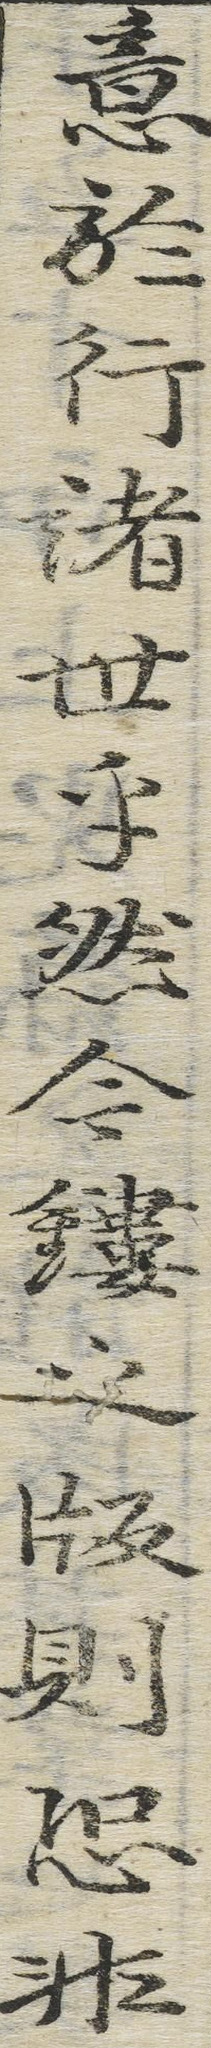意於行諸世乎然今鏤之版則恐非
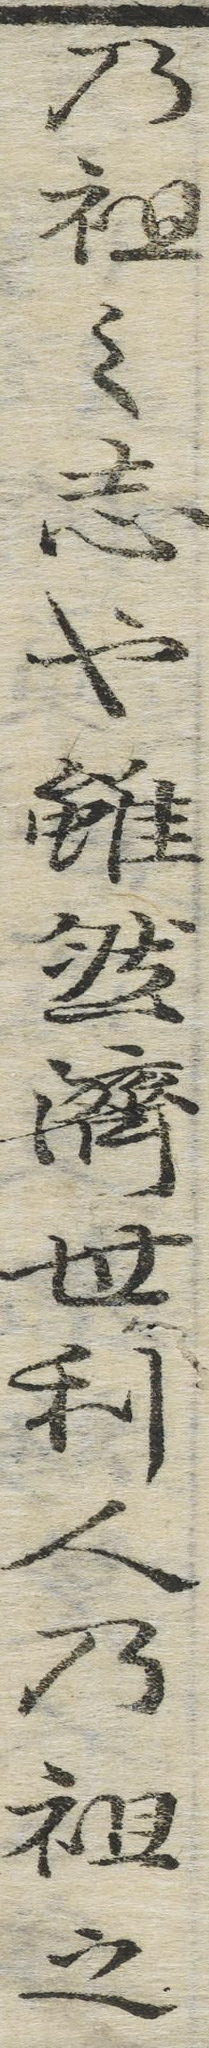乃祖之志也雖然済世利人乃祖之
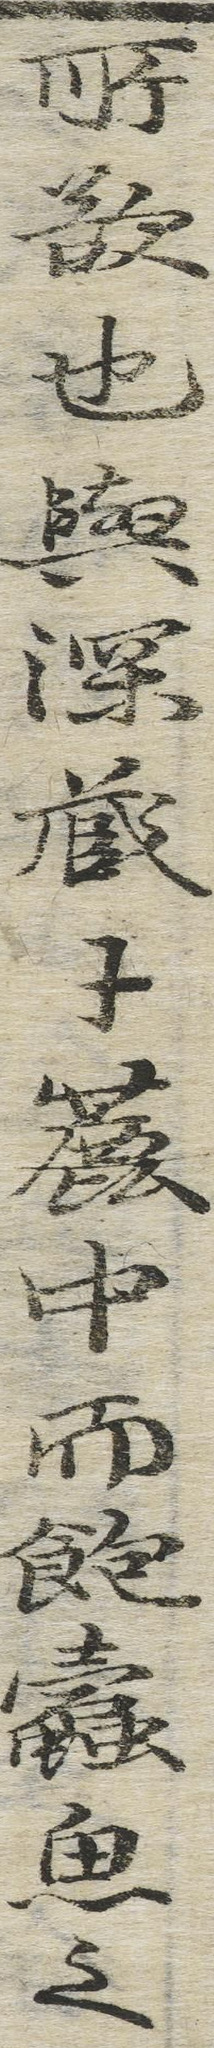所欲也与深蔵于麓中而飽蠧魚之
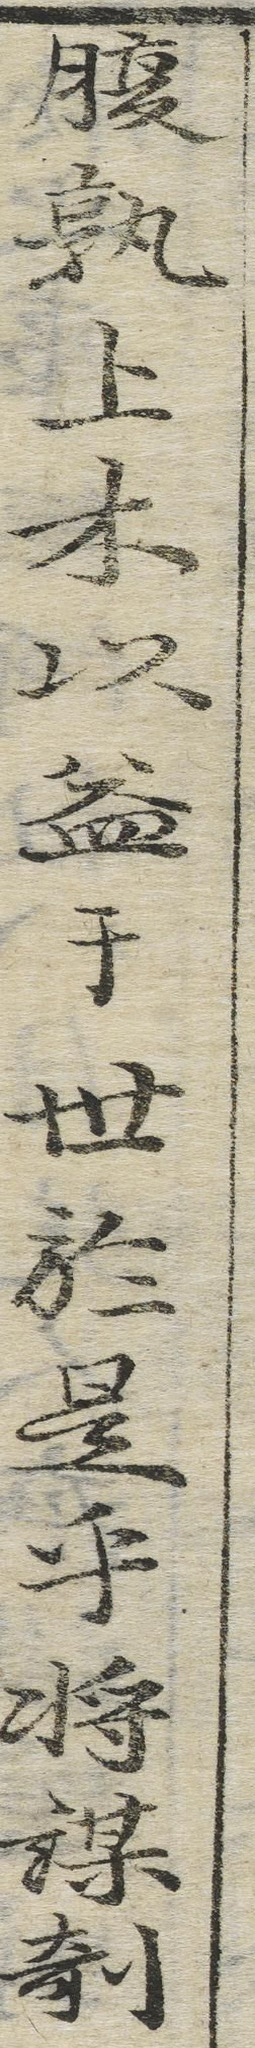腹孰上木以益于世於是乎将謀剞

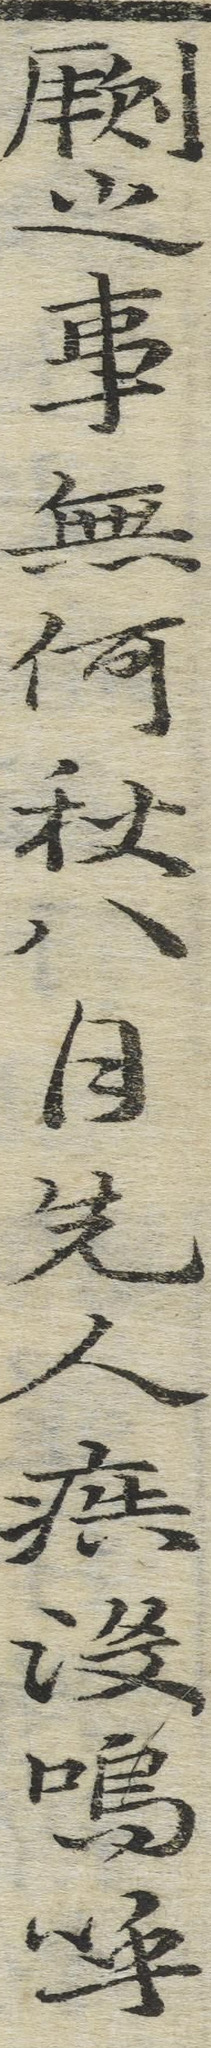劂之事無何秋八月先人疾没嗚呼
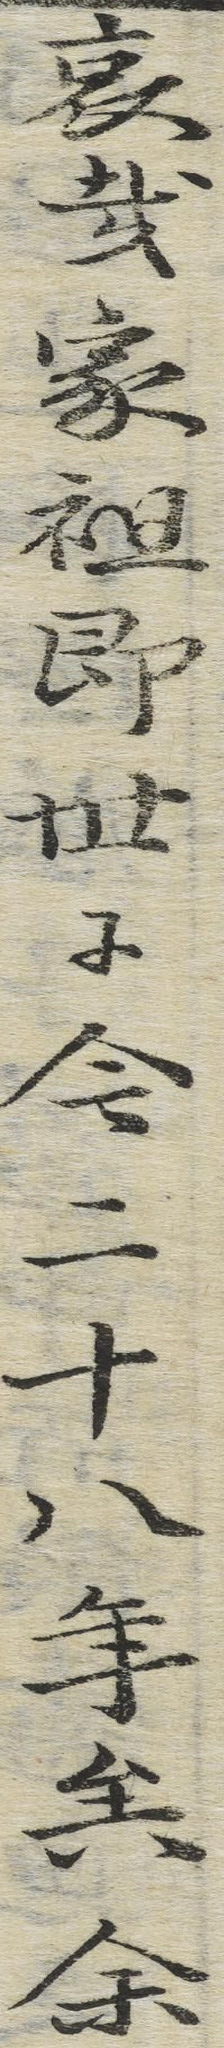哀哉家祖即世于今二十八年矣余
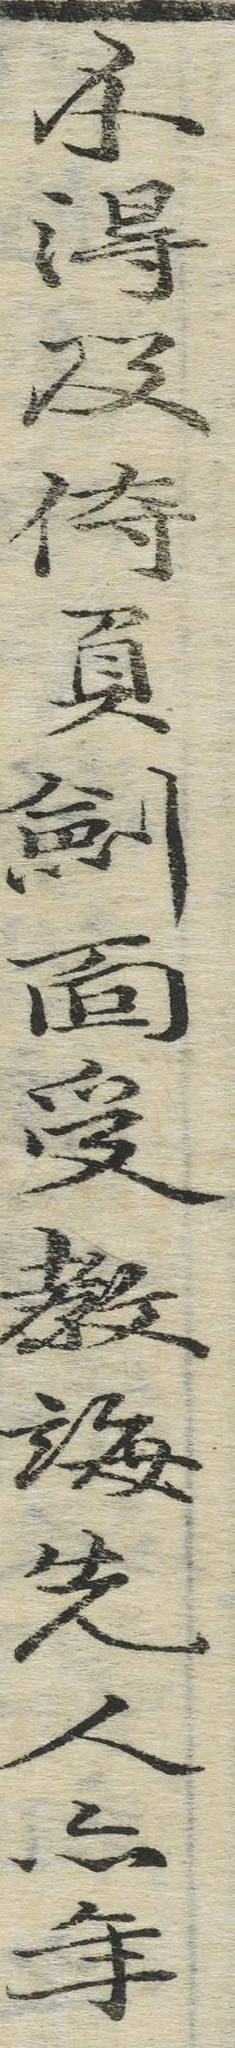不得及侍負剣面受教誨先人亦年
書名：温泉考
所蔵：東京大学地震研究所図書室 Earthquake Research Institute Library, The University of Tokyo, JAPAN
